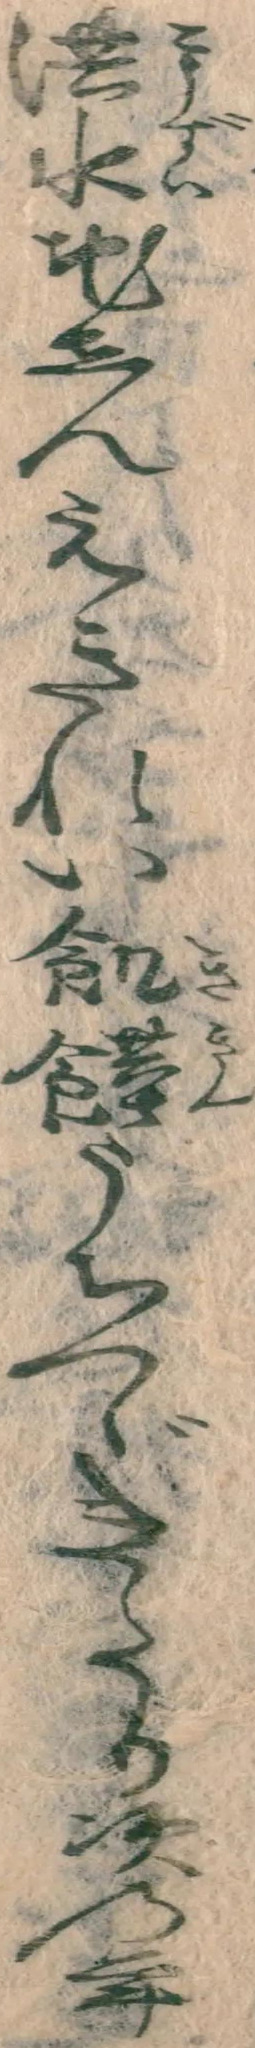洪水地しんえきれい飢饉うちつゞきたり次の年
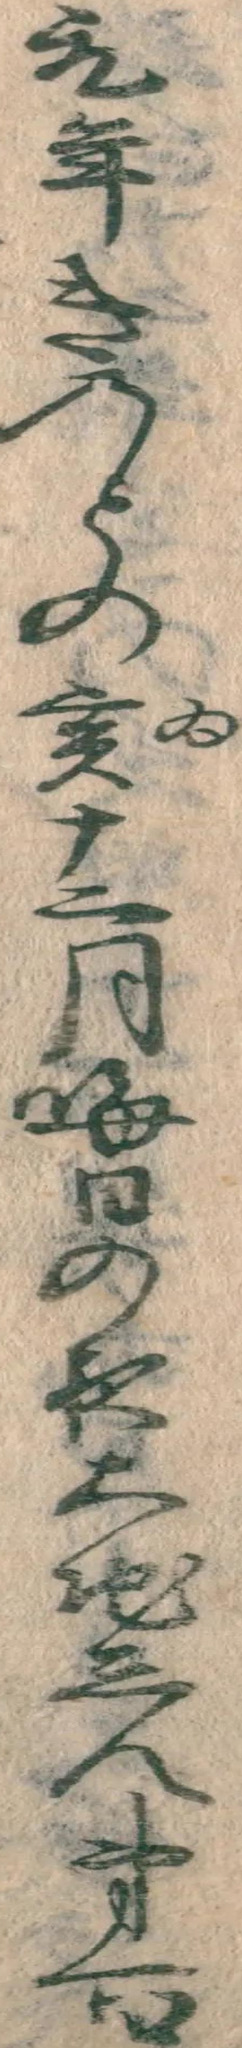元年きのとの亥十二月晦日の夜大地しん第百
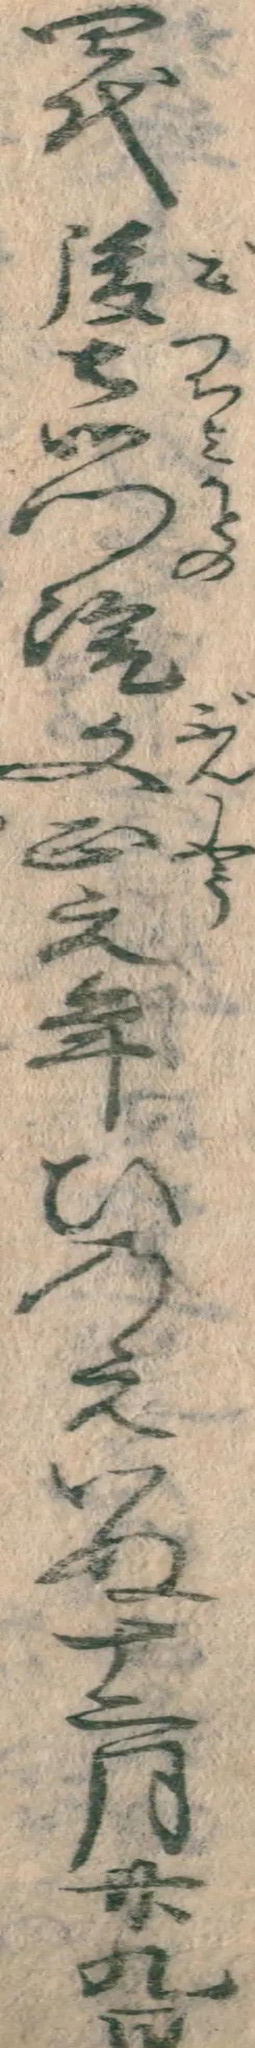四代後土御門院文正元年ひのえいぬ十二月廿九日
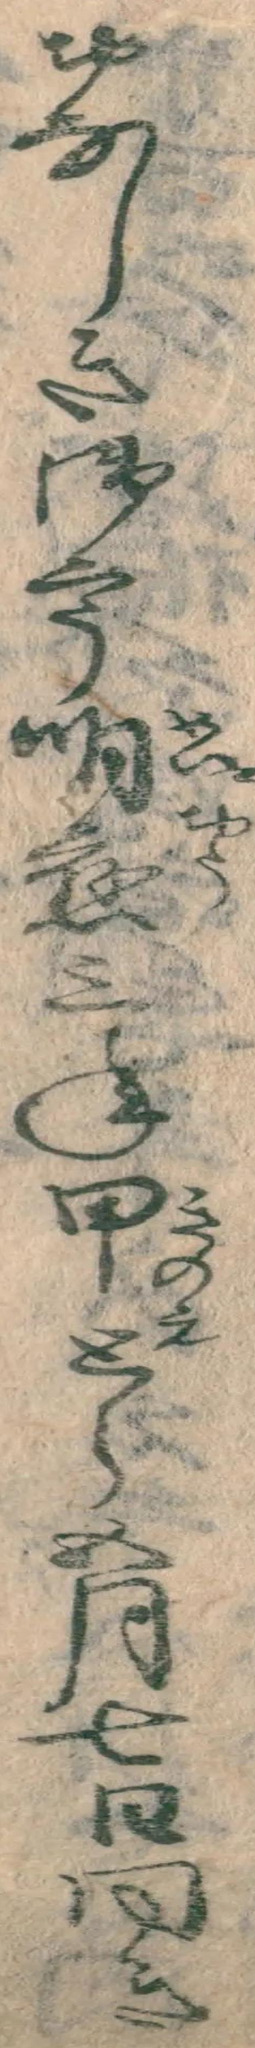おなしき御宇明應三年甲とら五月七日同き
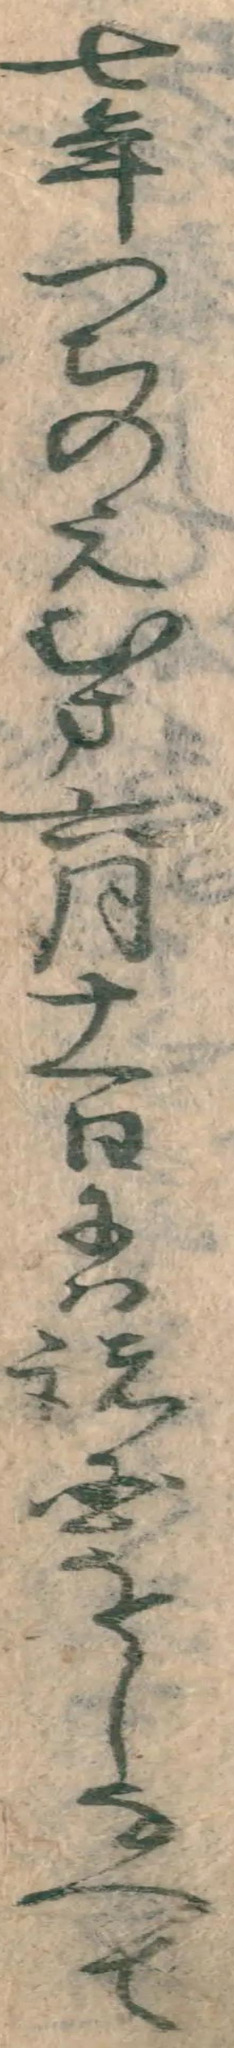七年つちのえむま六月十一日には諸国をしなへて

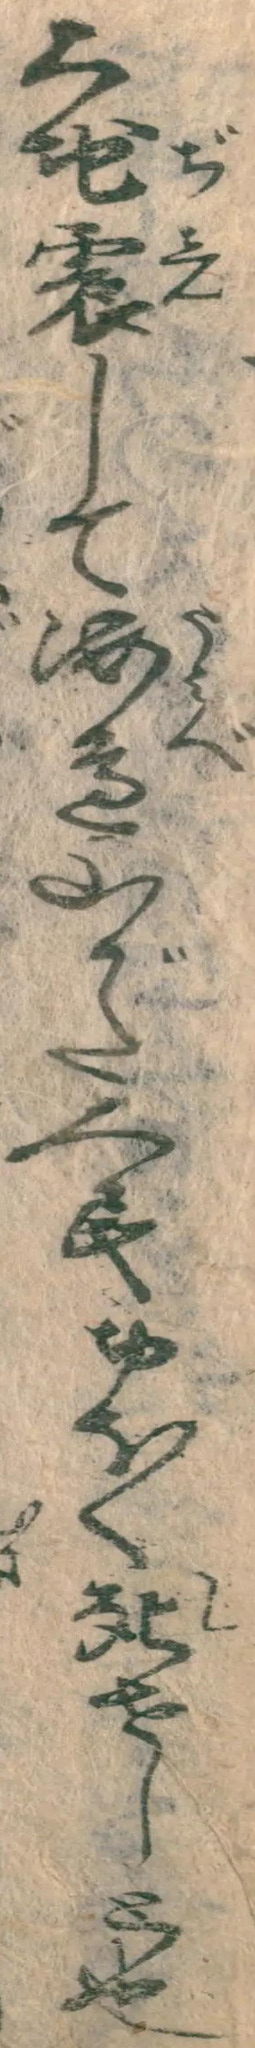大地震して海邊山がた人民おほく死せしと也
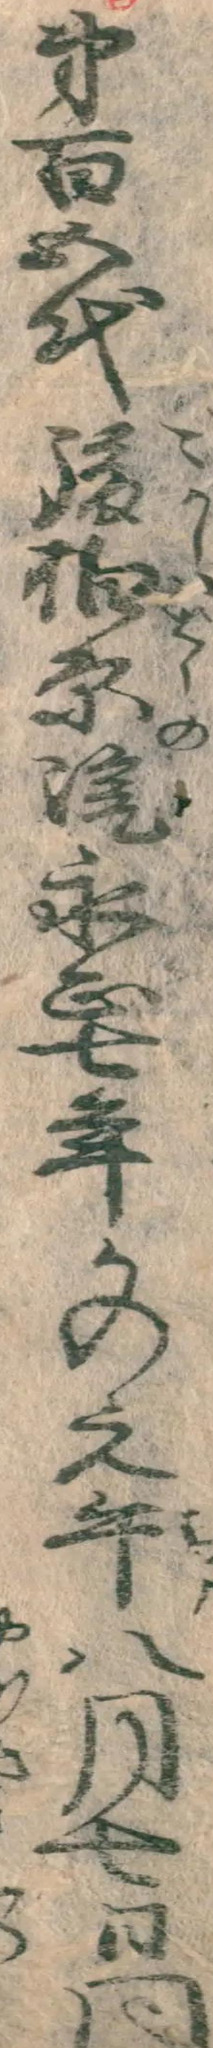第百五代後柏原院永正七年かのえ午八月七日同
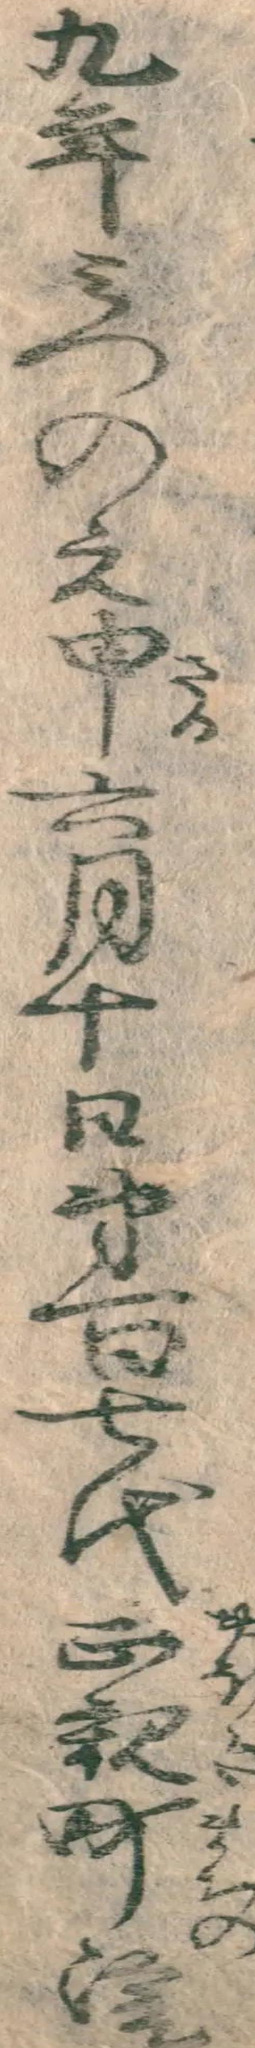九年みつのえ申六月十日第百七代正親町院
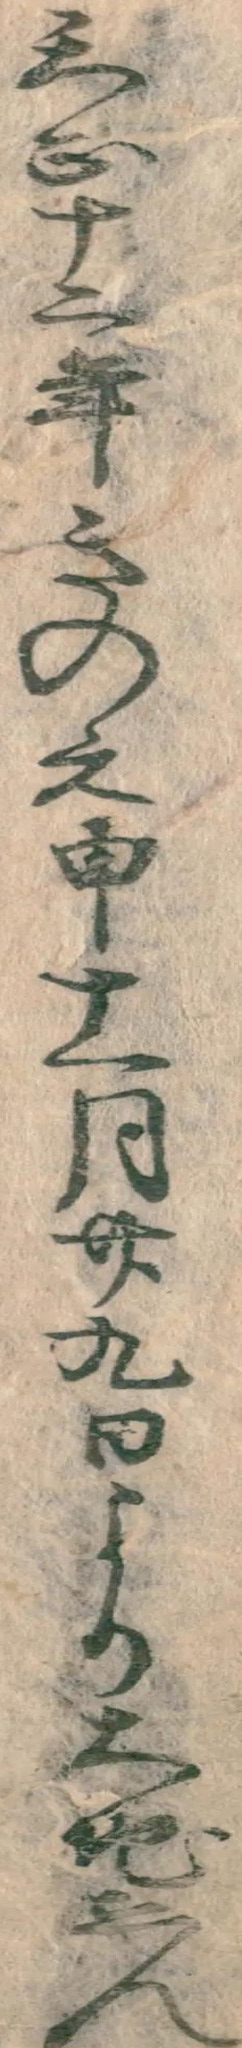天正十二年きのえ申十一月廿九日より大地しん
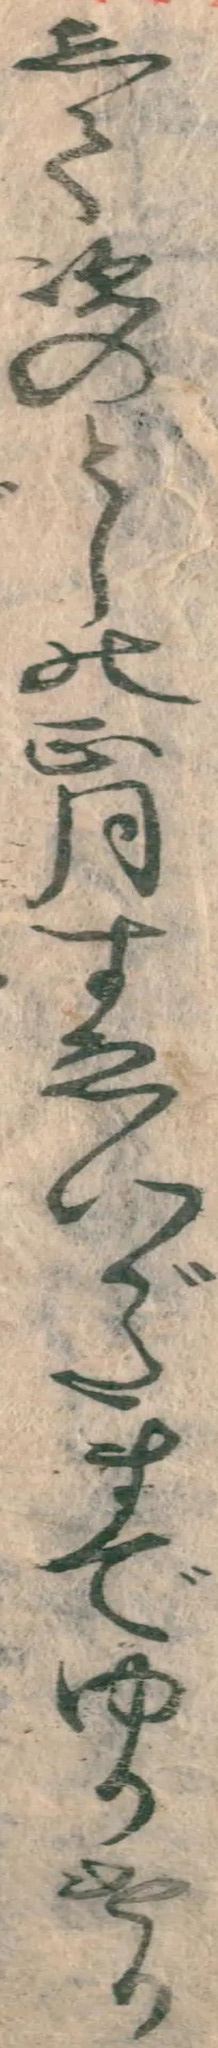して次のとしの正月すゑつがたまでゆりけり
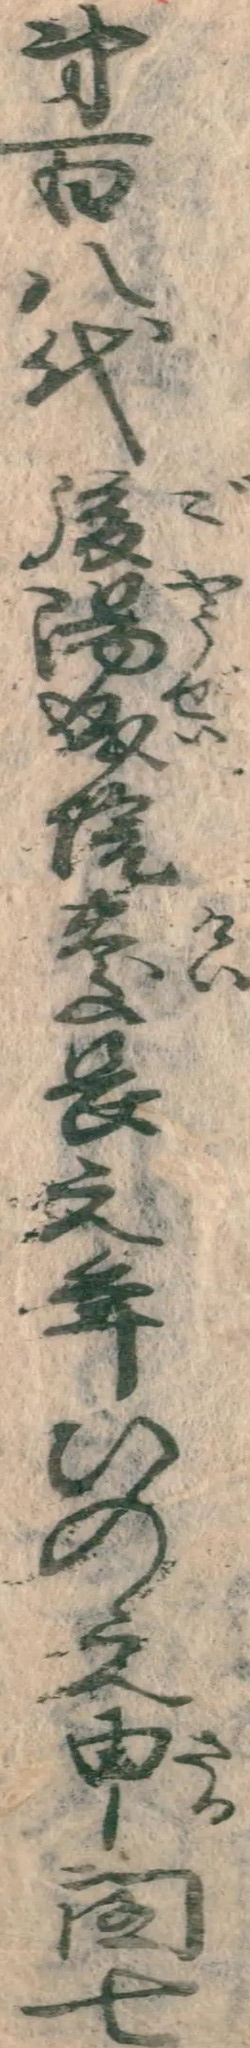第百八代後陽成院慶長元年ひのえ申同七
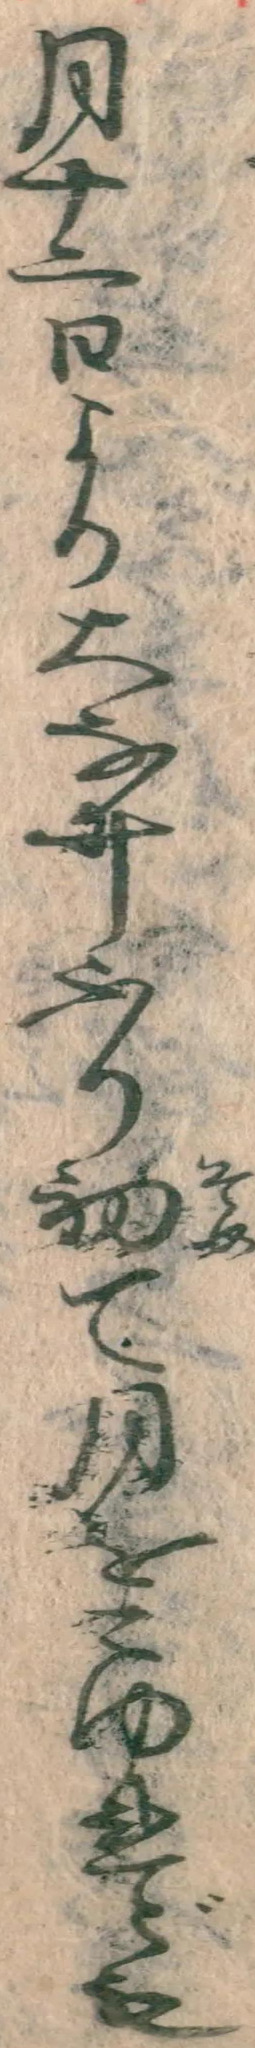月十二日より大なゐふり初て月をこゆれども
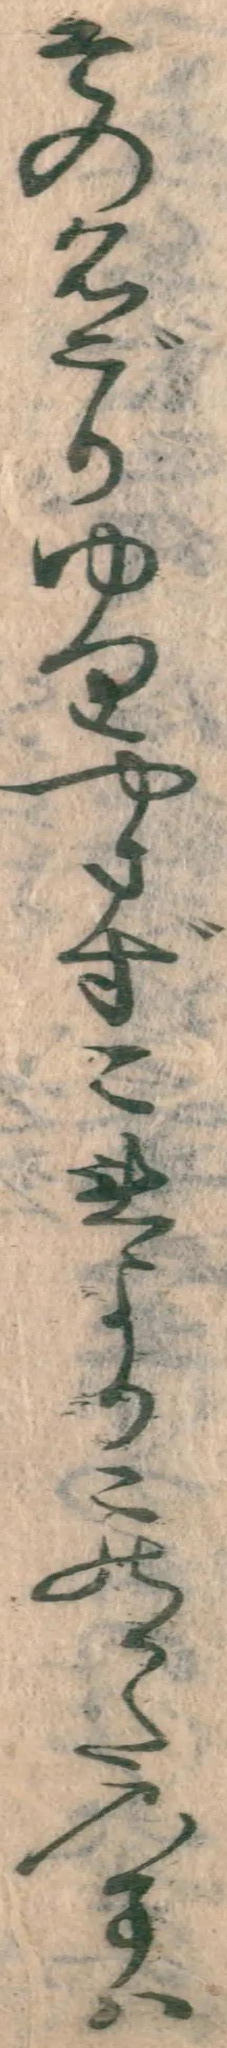その名ごりゆりやまずこれよりこのかたの事は
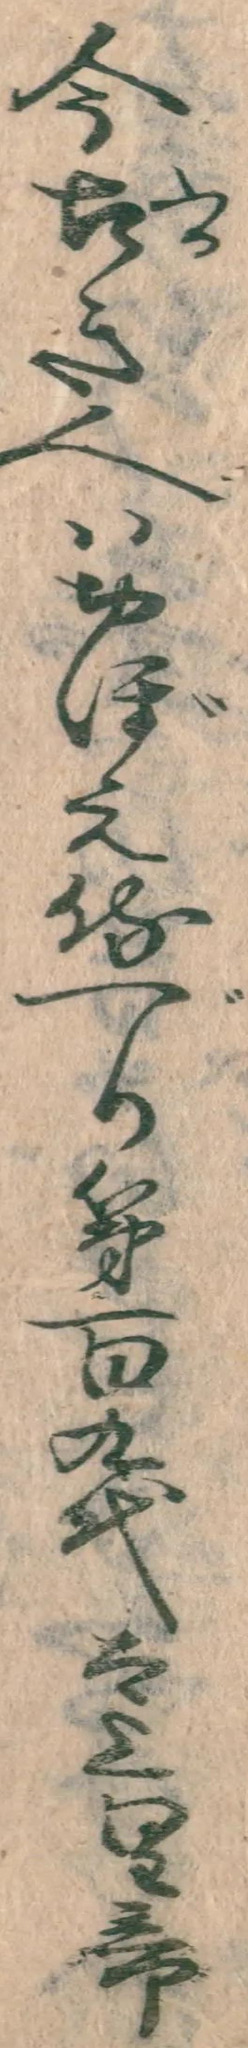今古き人はおぼえ侍べり第百九代太上皇帝
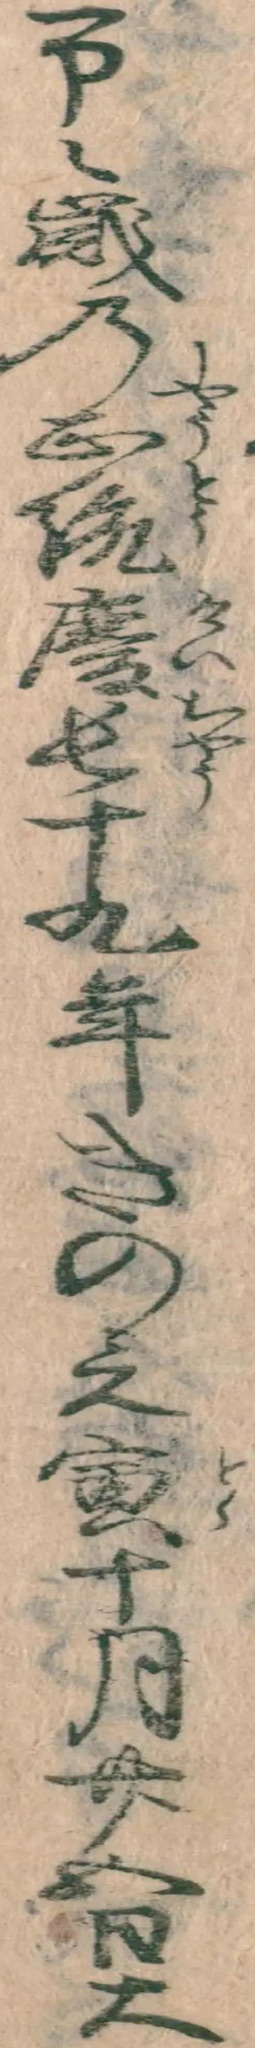万々歳の正統慶長十九年きのえ寅十月廿五日大
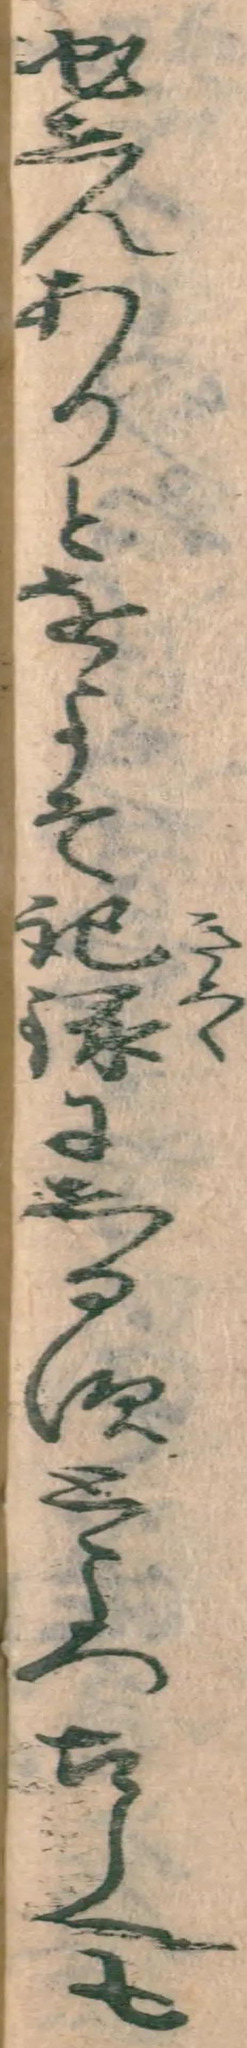地しんありとをよそ記録にしるすところ古しへも
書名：艱難目異志. 上,下
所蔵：国立国会図書館 National Diet Library, JAPAN
